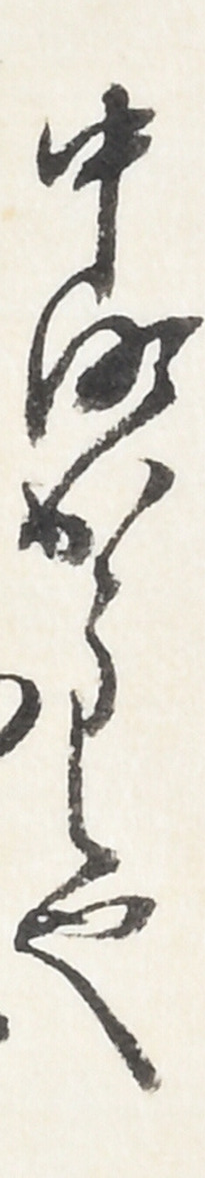中町かうしや
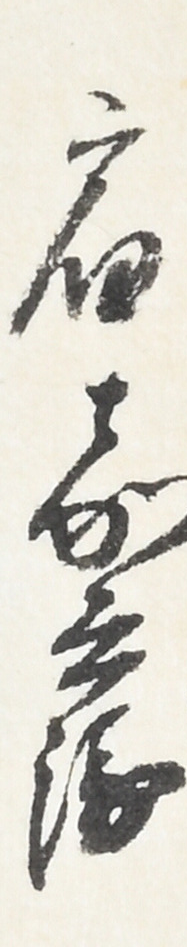宿嘉兵衛
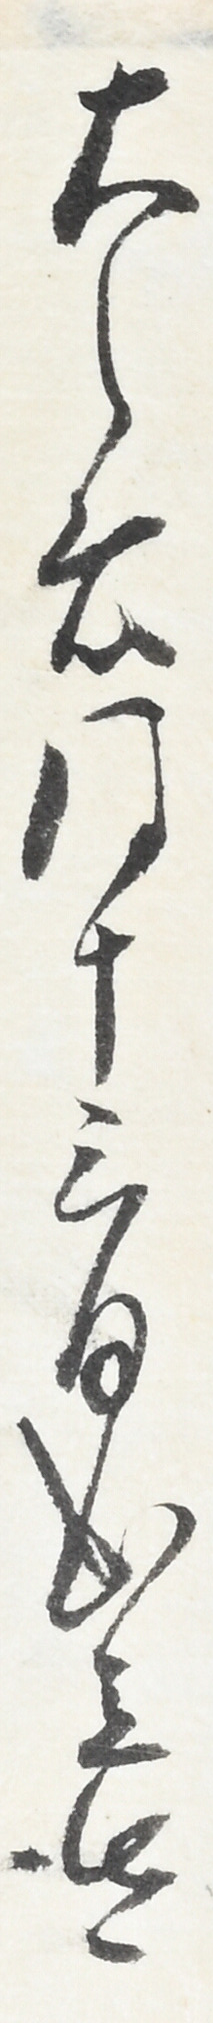右之者同十三日出立仕候
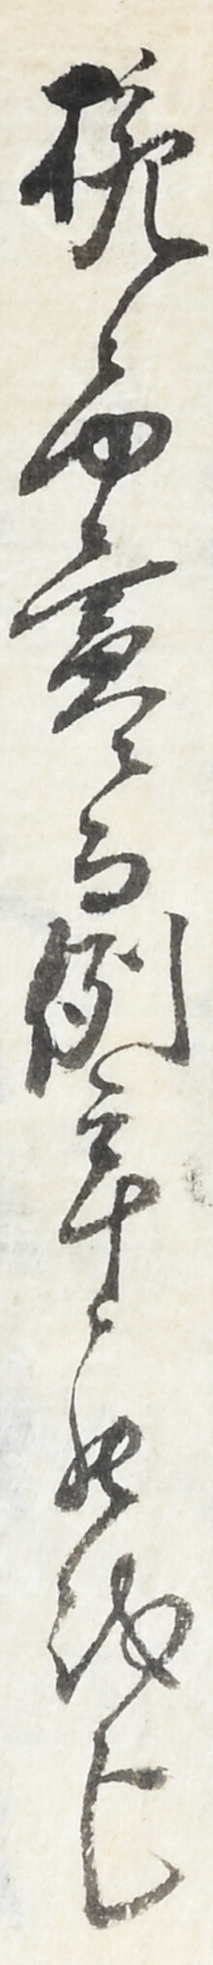打物商売ニ而例年罷越申候

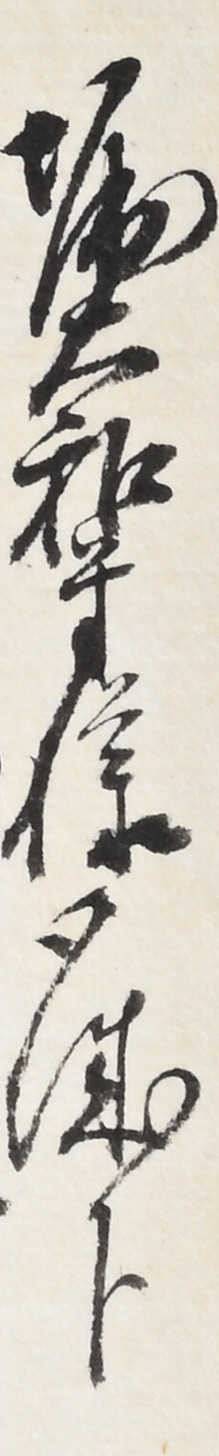堀大和守様御城下
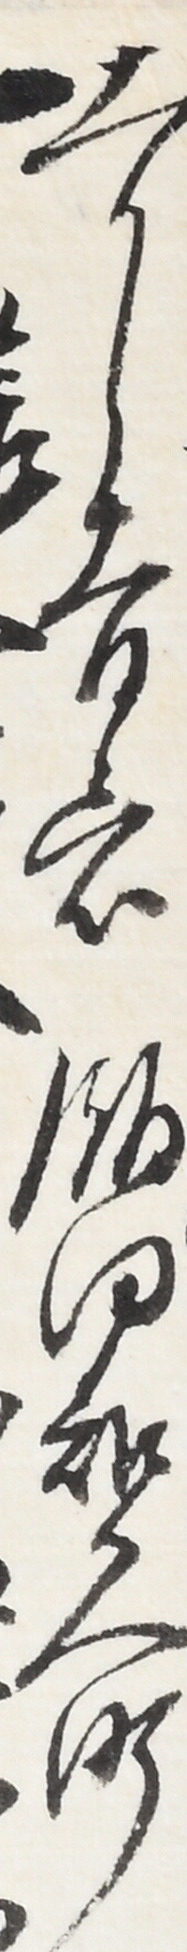十一月十一日着飯田知久町
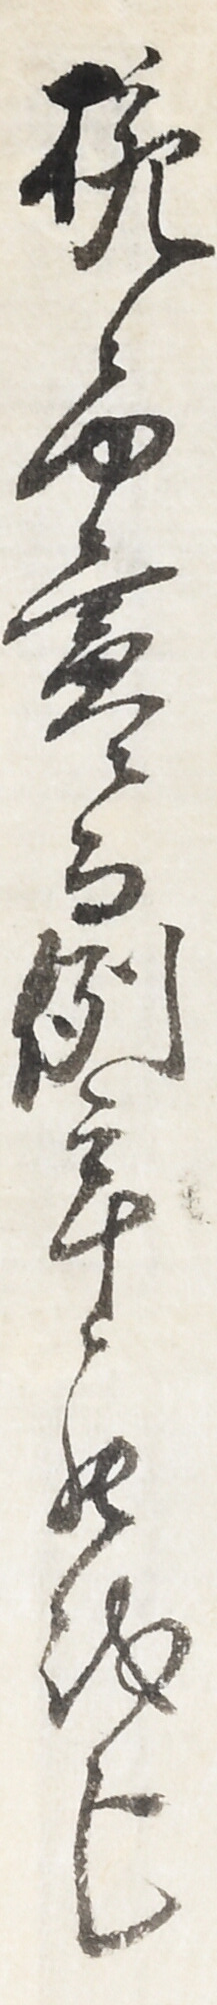椀商売ニ而例年罷越申候
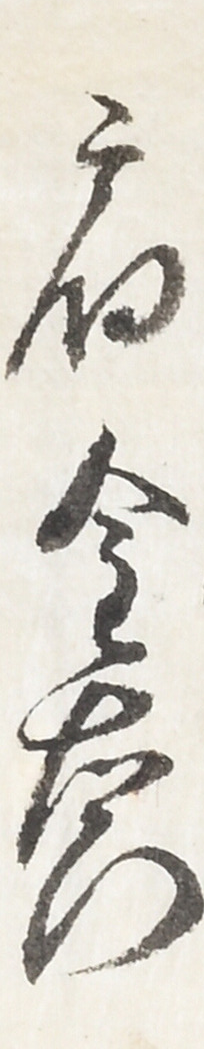宿金右衛門
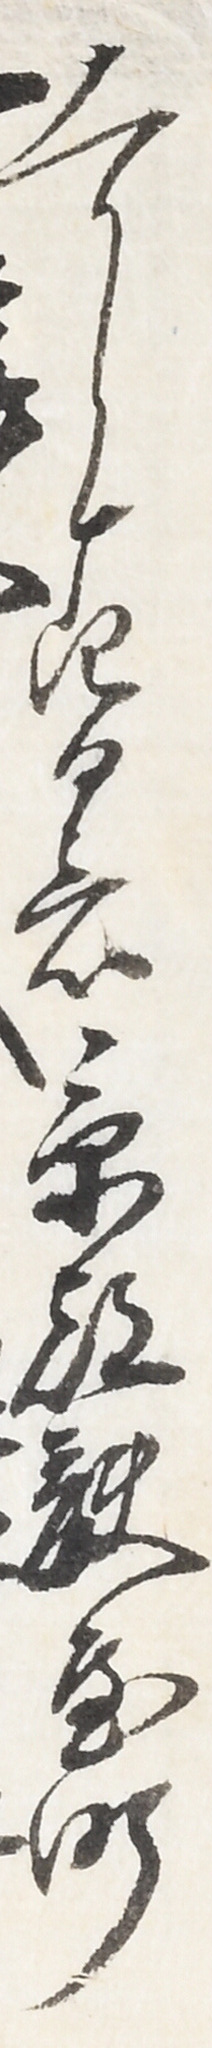十一月十四日着京都麩屋町
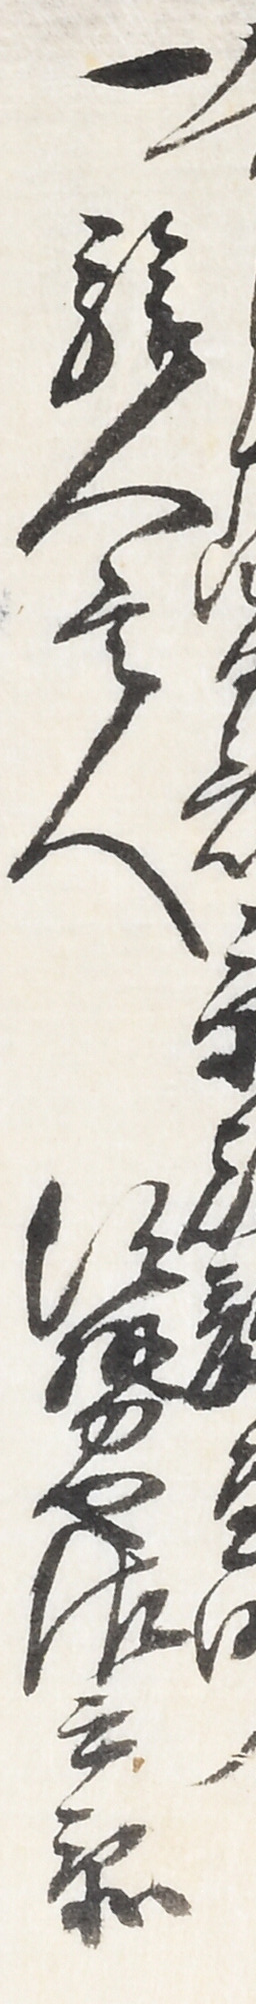一旅人壱人伊勢や佐兵衛
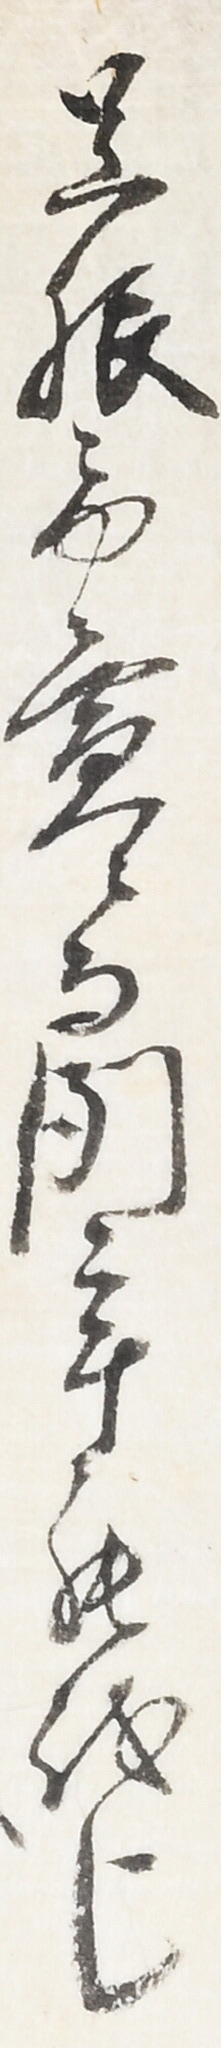呉服商売ニ而例年罷越申候
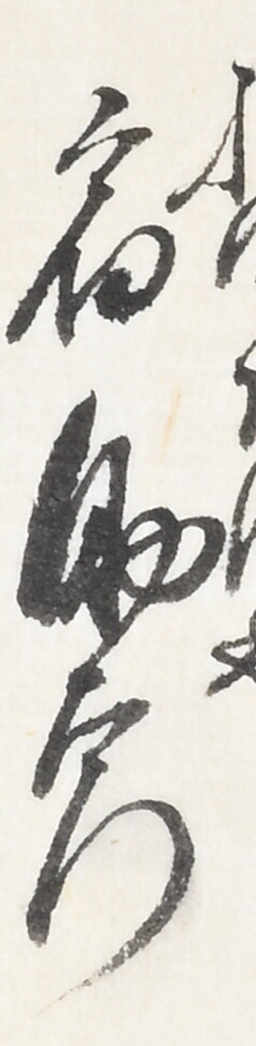宿助右衛門
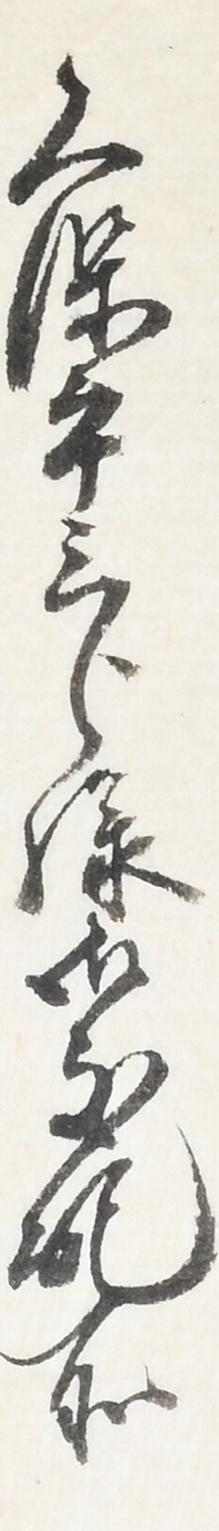久保平三郎様御支配所
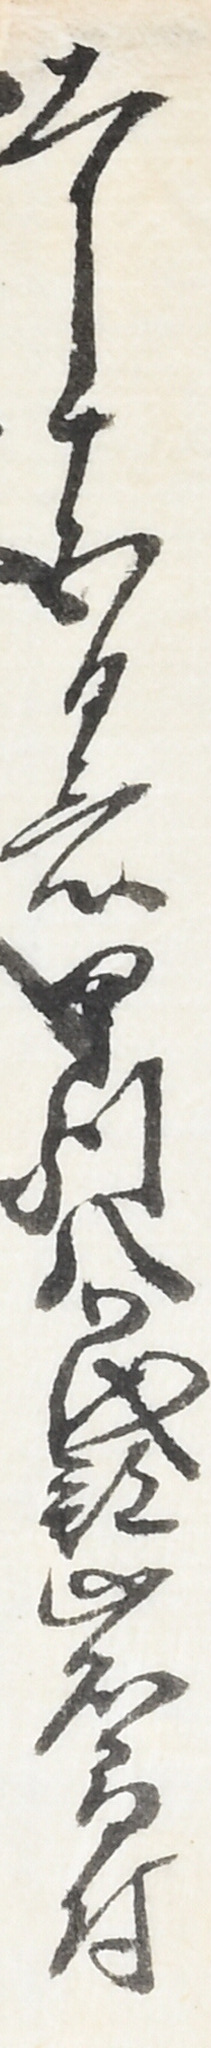十一月十五日着甲州八代郡岩間村
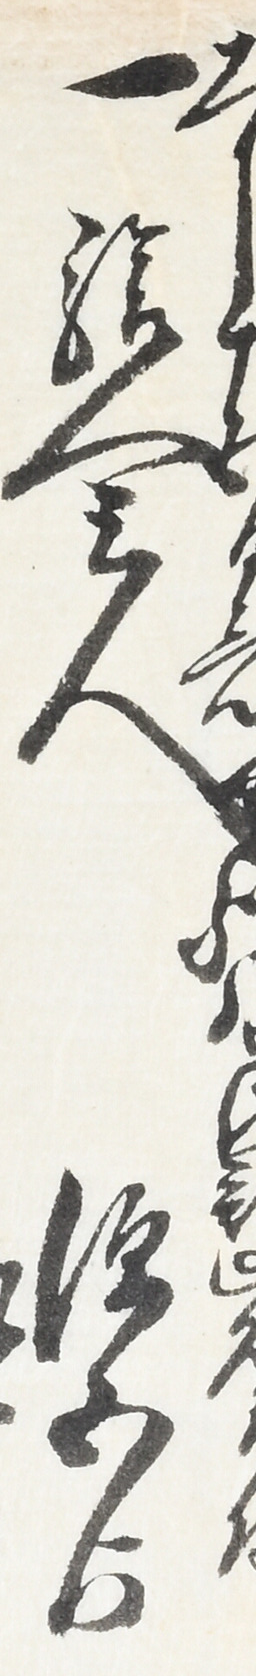一旅人三人源五衛門
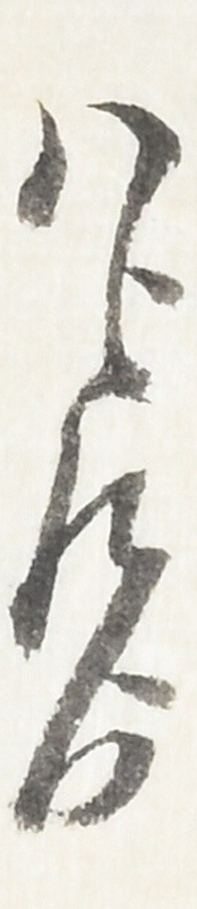八郎左衛門
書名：旅人泊控帳
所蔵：伊那市立高遠町図書館・合同会社AMANE
